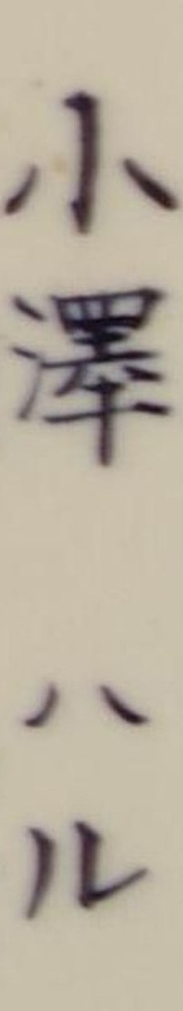小澤ハル
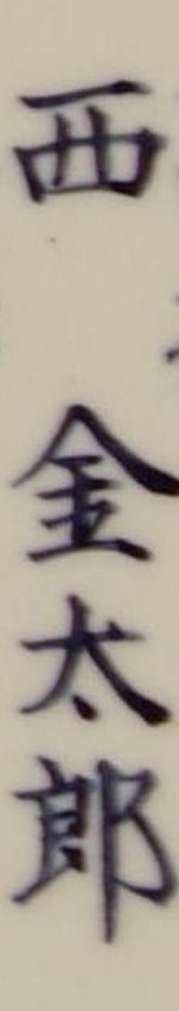西金太郎
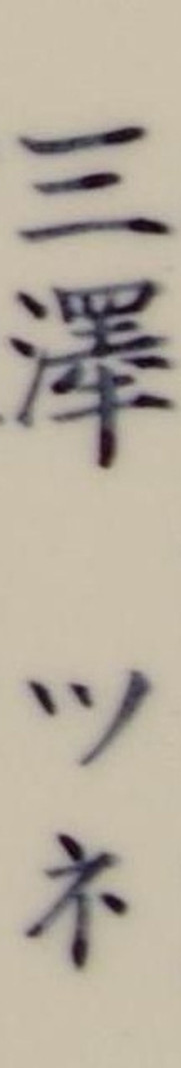三澤ツネ
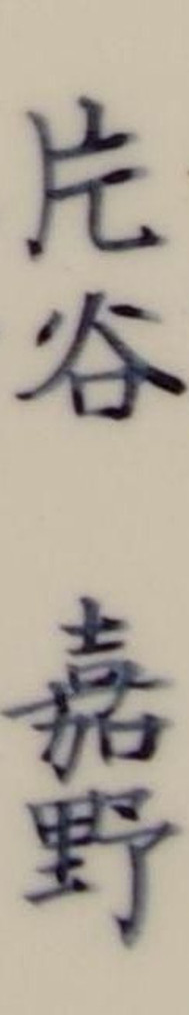片谷嘉野
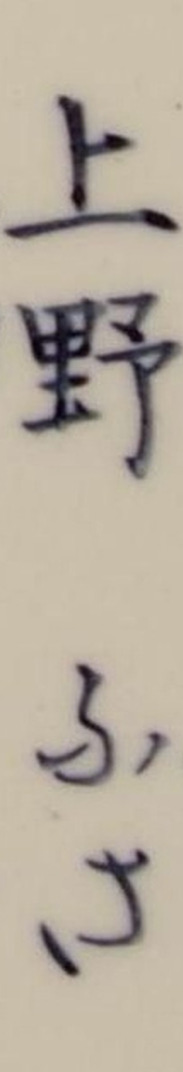上野ふさ
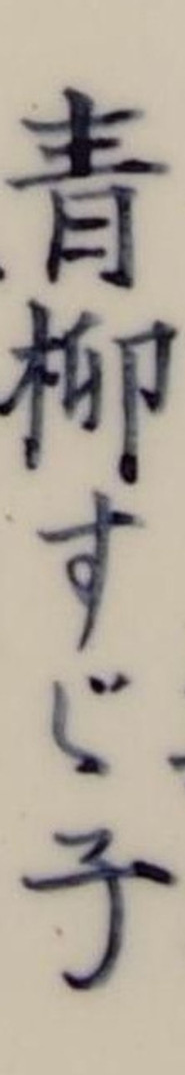青柳すだ子
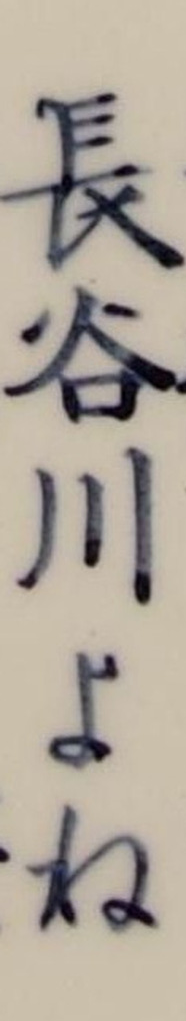長谷川よね
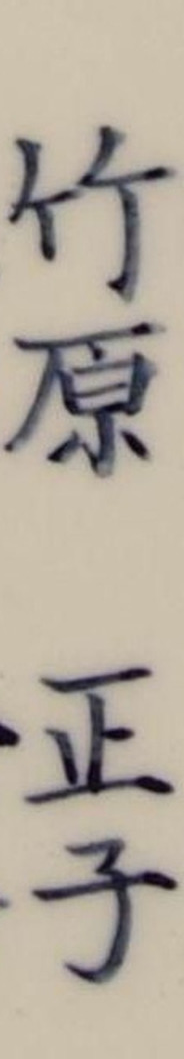竹原正子
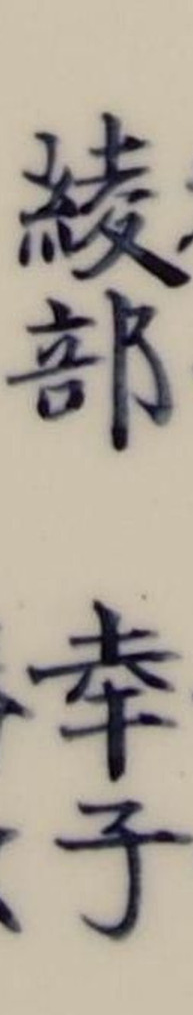綾部幸子
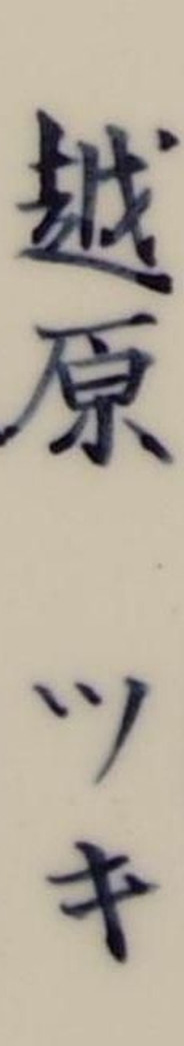越原ツキ
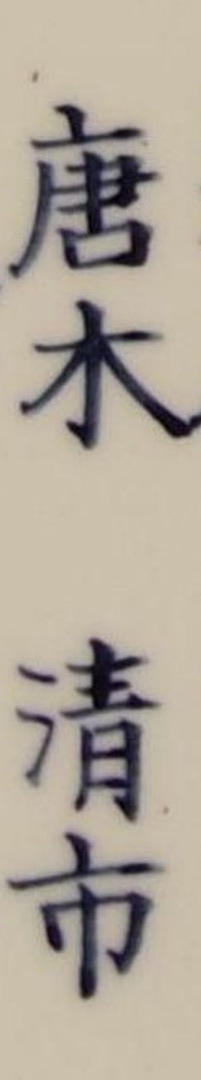唐木清市
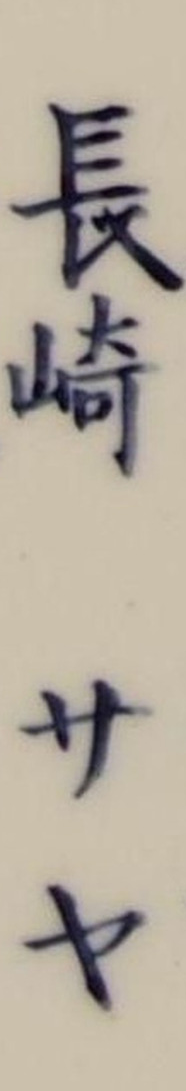長崎サヤ
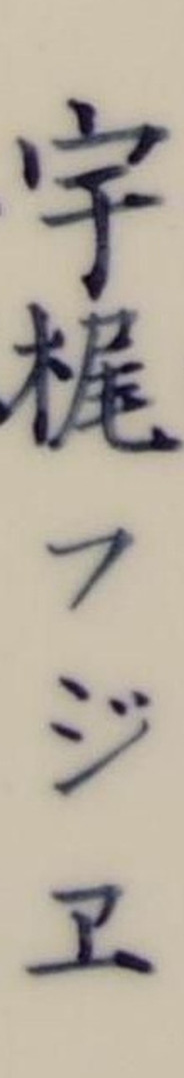宇梶フジエ
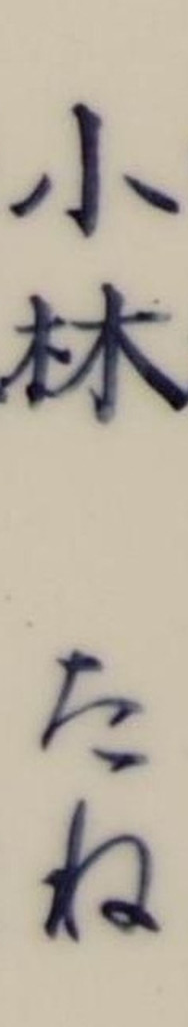小林たね
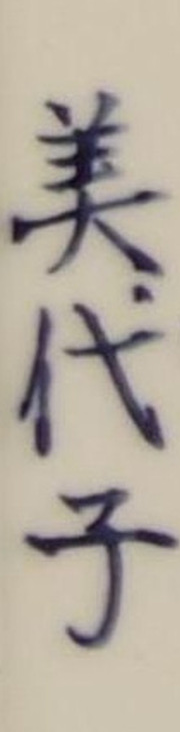美代子

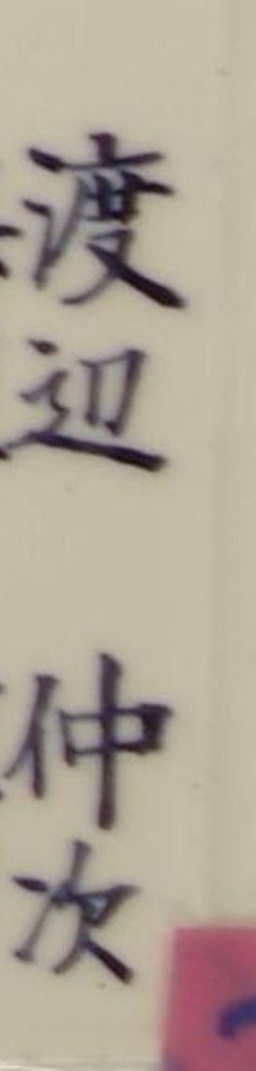渡辺仲次
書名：E~L
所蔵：高野山金剛峯寺
